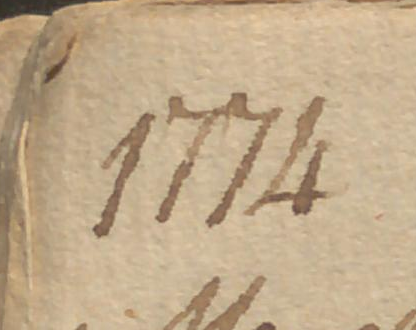1774
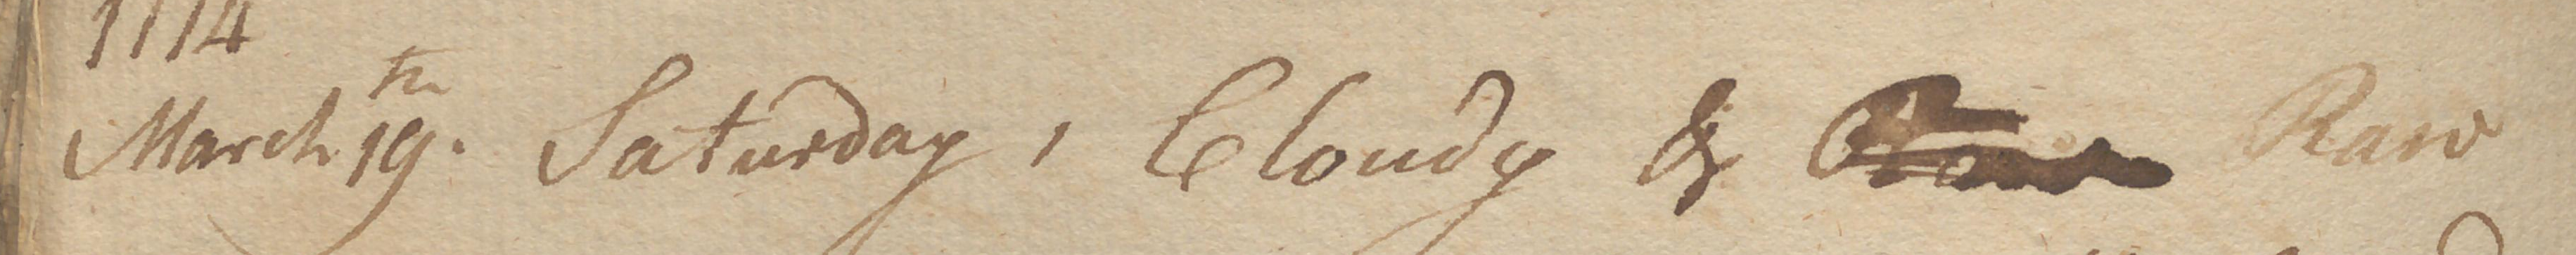March 19^th. Saturday, Cloudy & [Rain] Raw
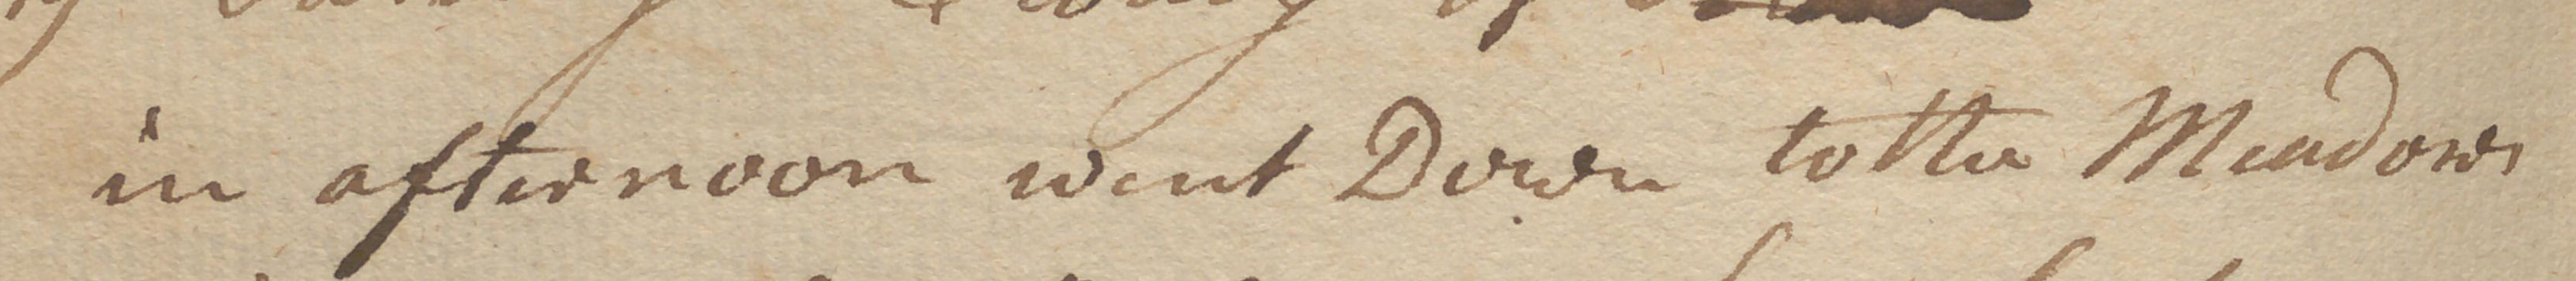in afternoon went Down to the Meadow
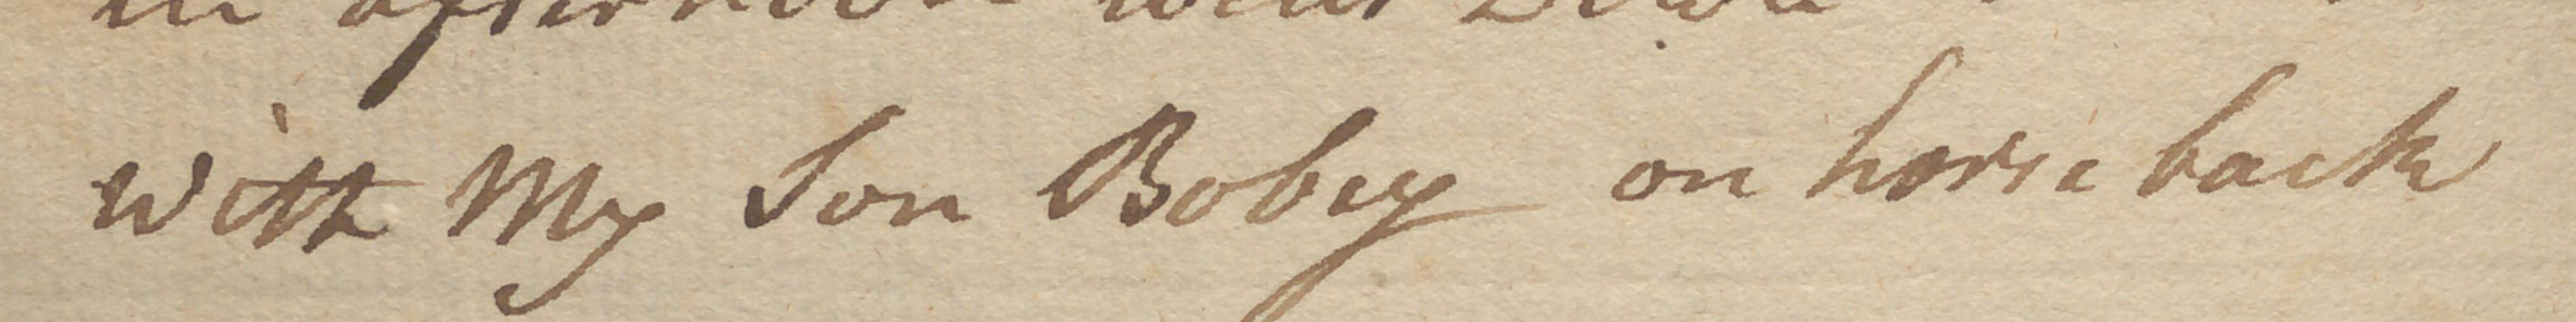with My Son Bobey on horse back
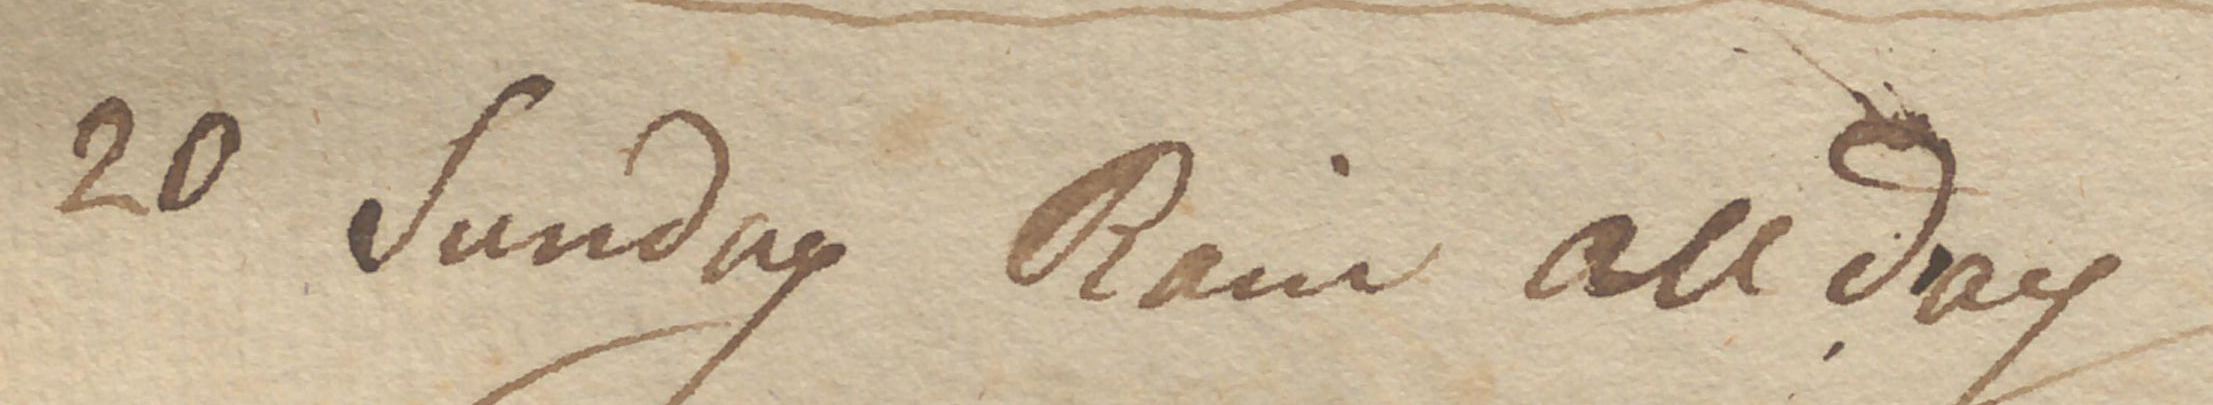20 Sunday Rain all day
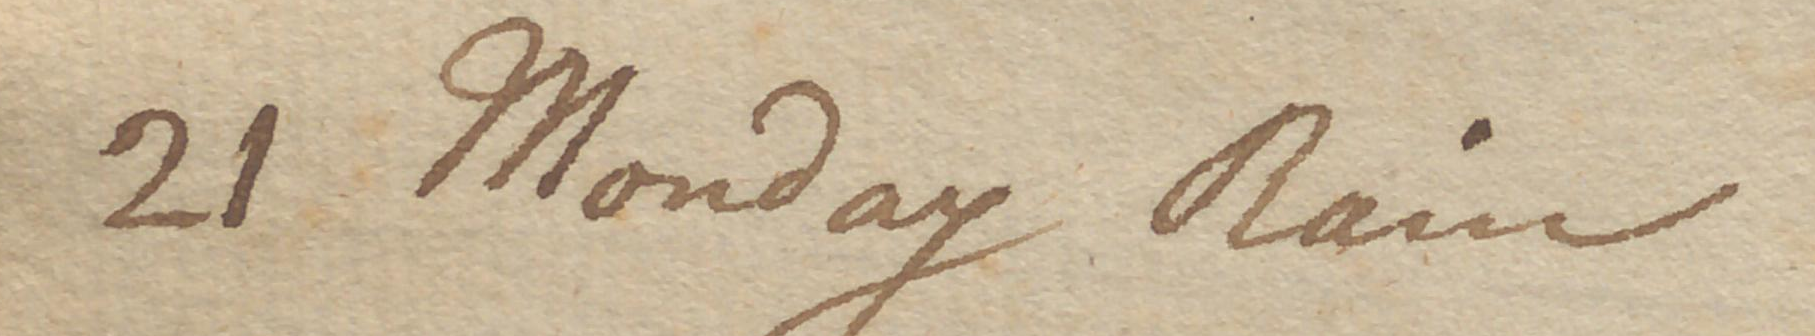21 Monday Rain
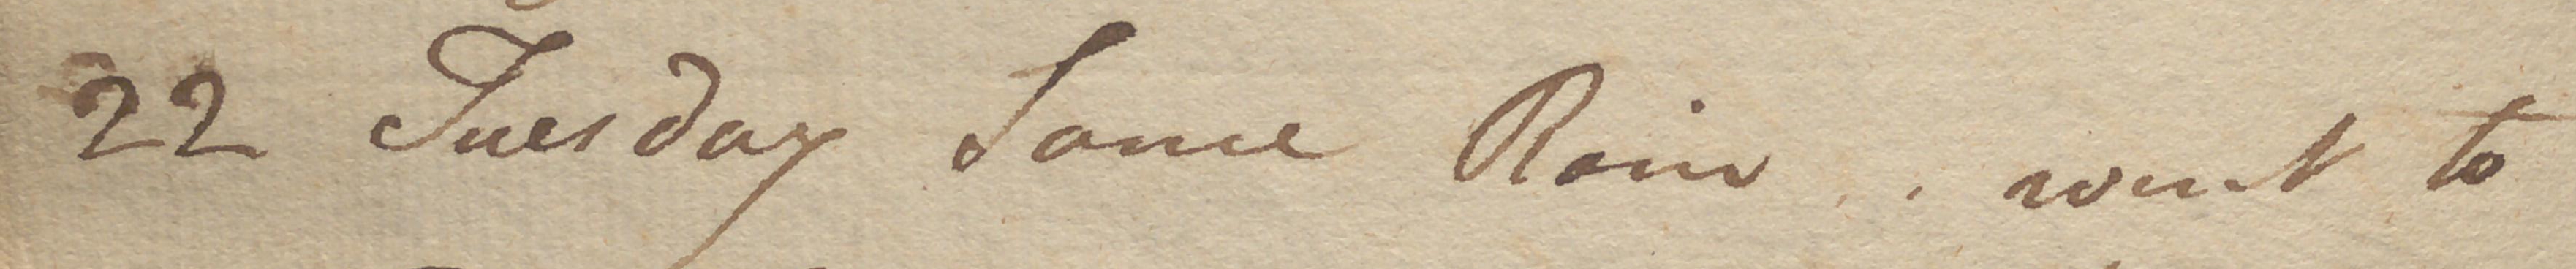22 Tuesday same Rain. went to
